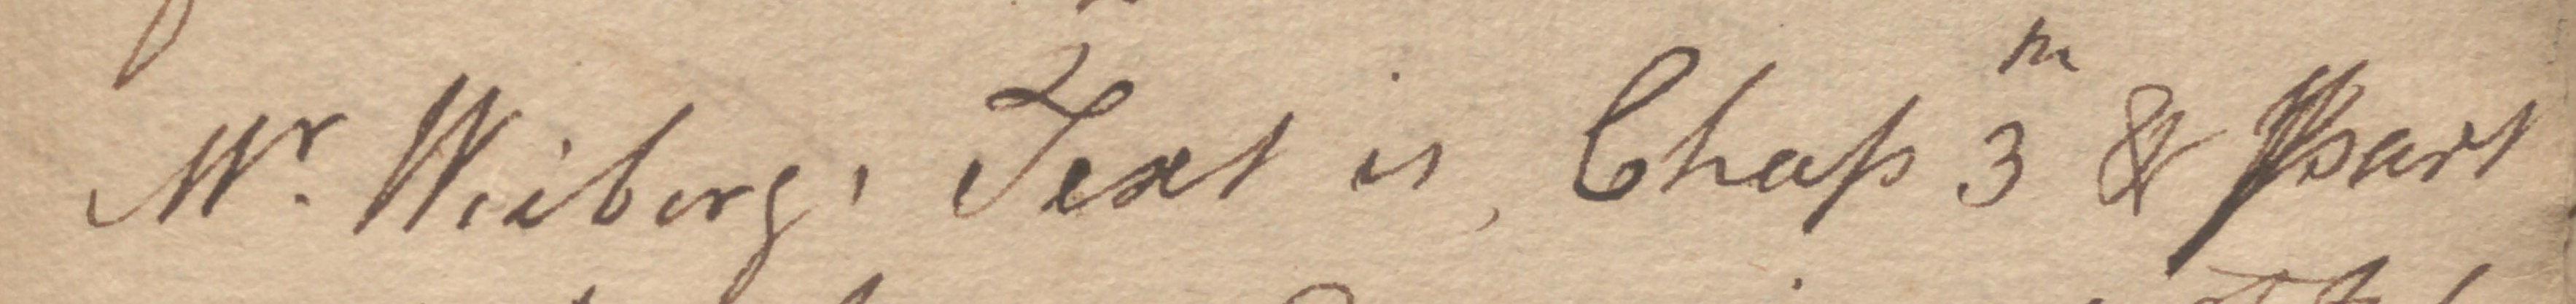M^r. Weibergs Text is Chap 3 & part
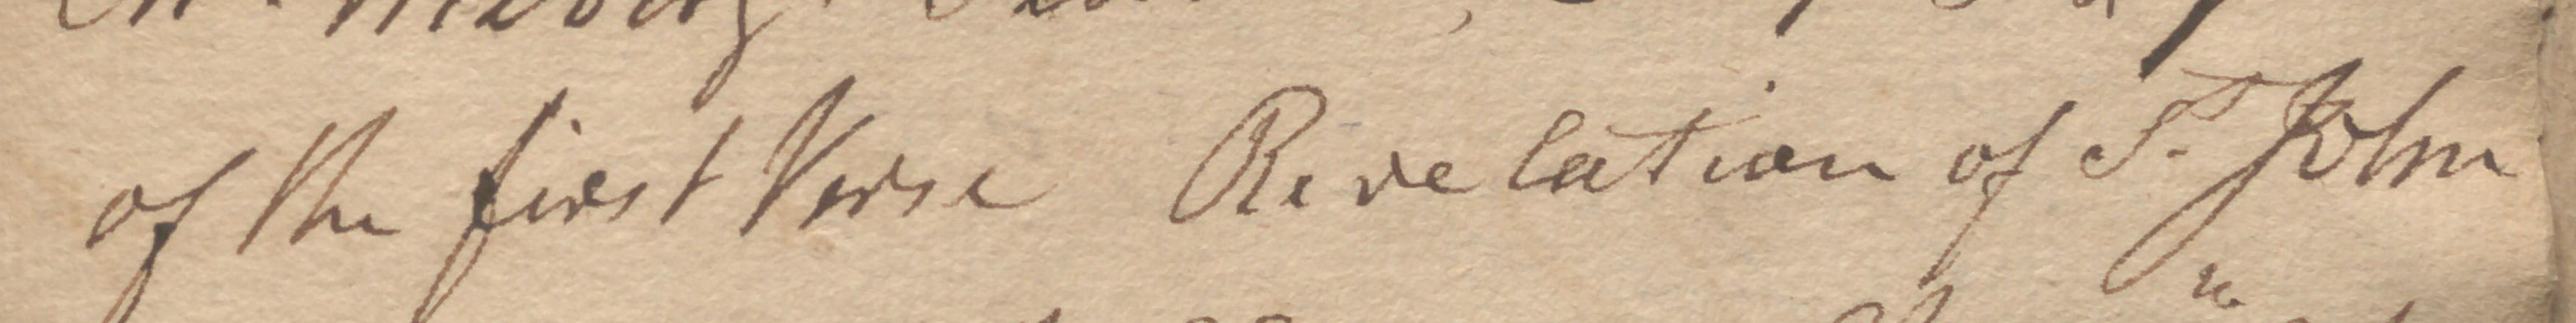of the first Verse Revelation of S^t. John
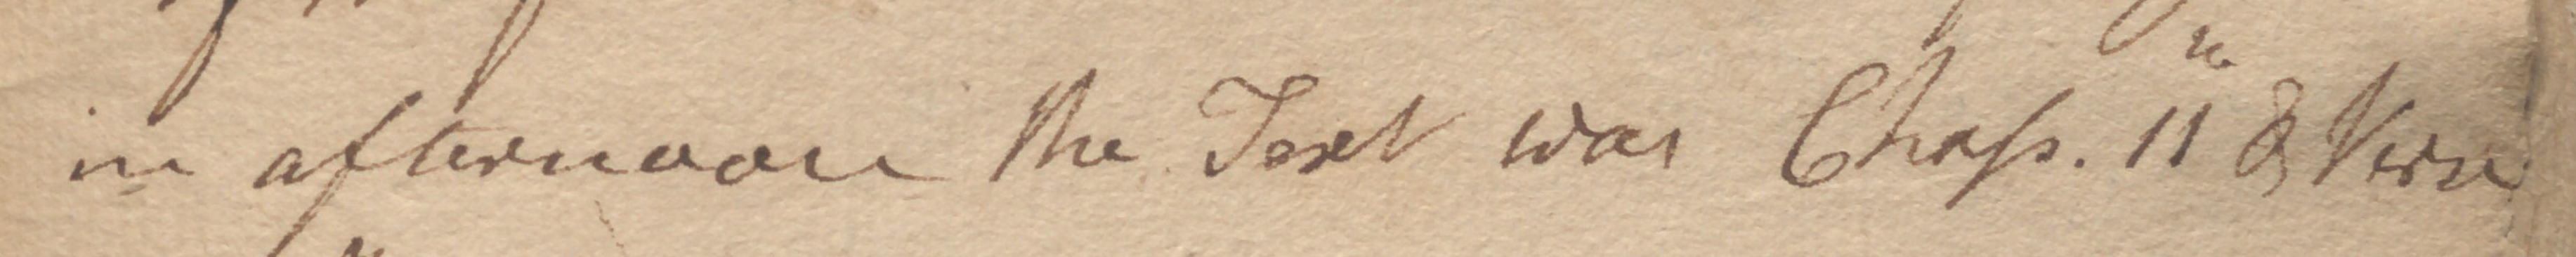in afternoon the Text was Chap. 11^th Verse
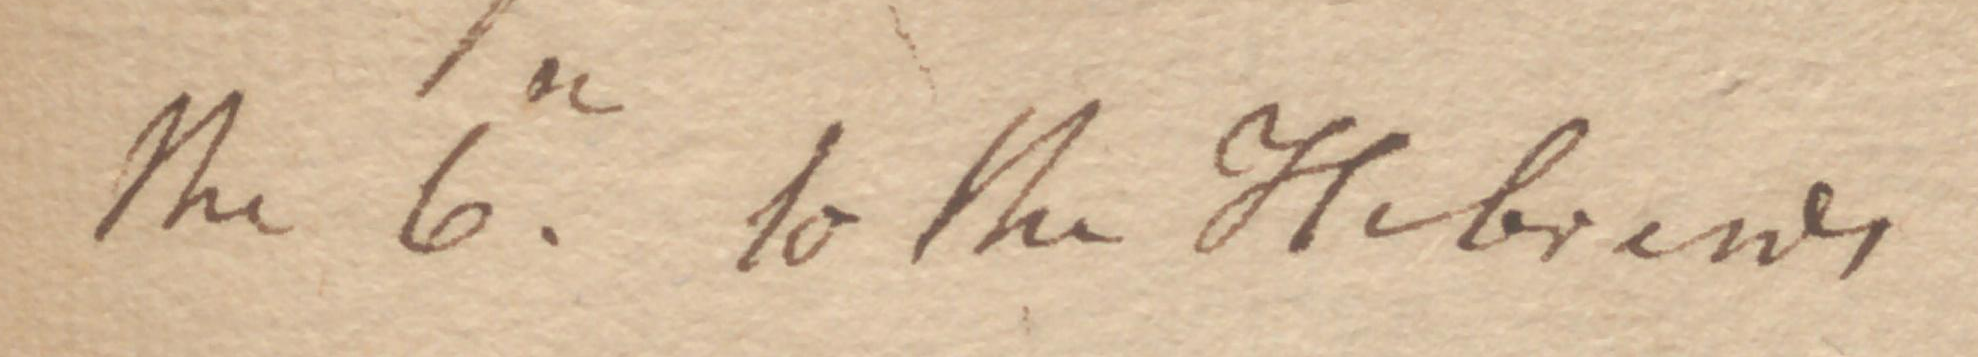the 6^th. to the Hebrews
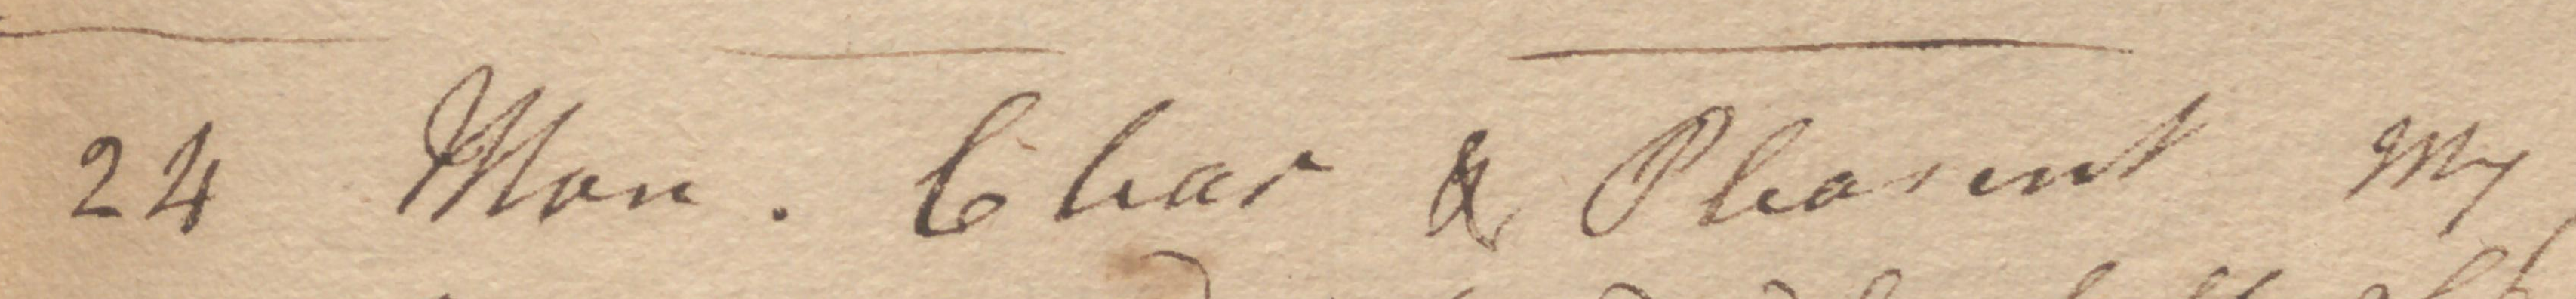24 Mon. Clear & Pleasent My
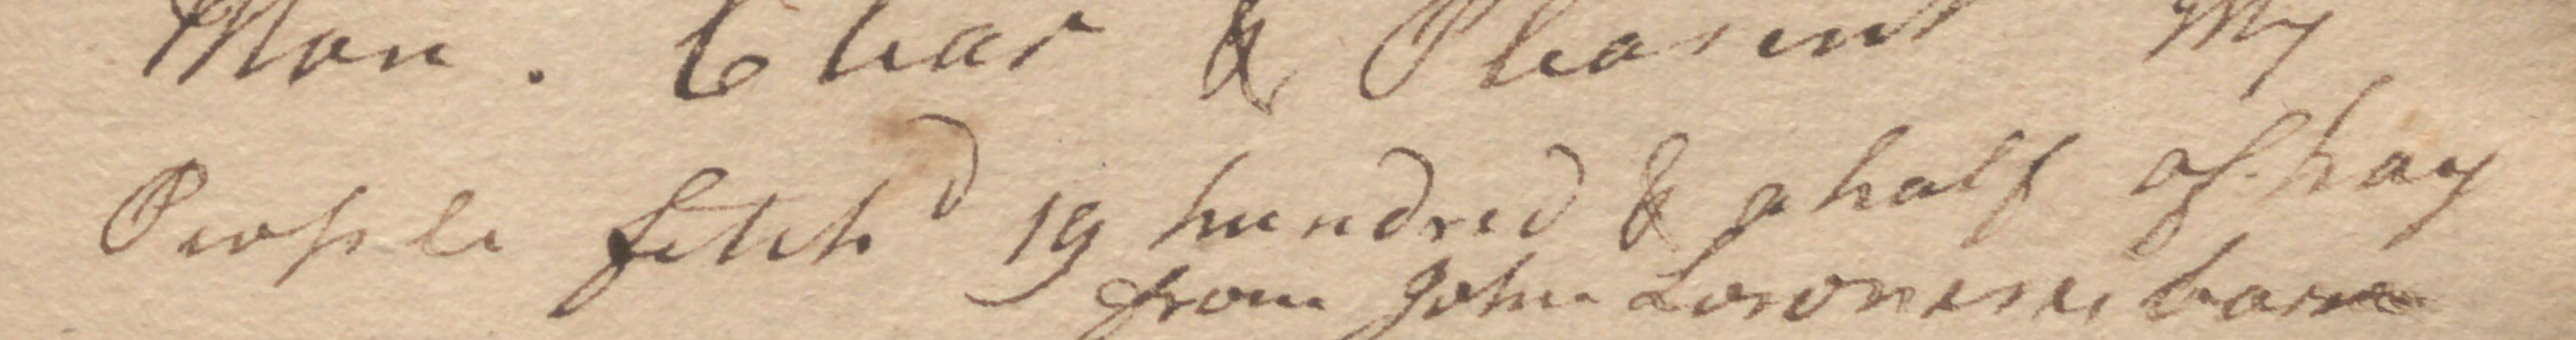People fetch^d 19 hundred & a half of hay
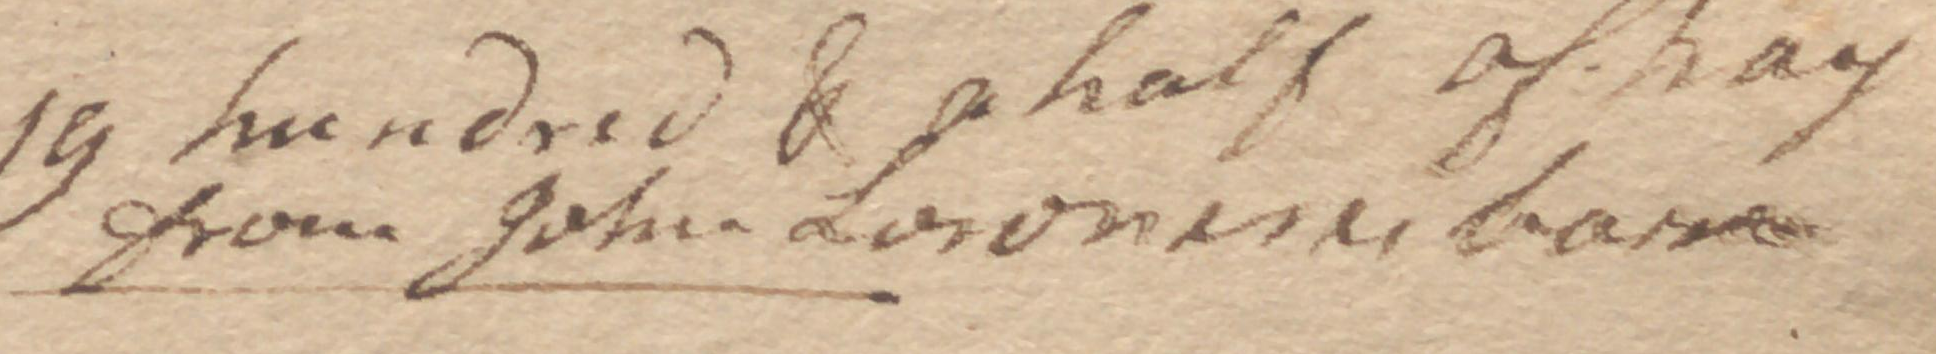from John Losonses barn
